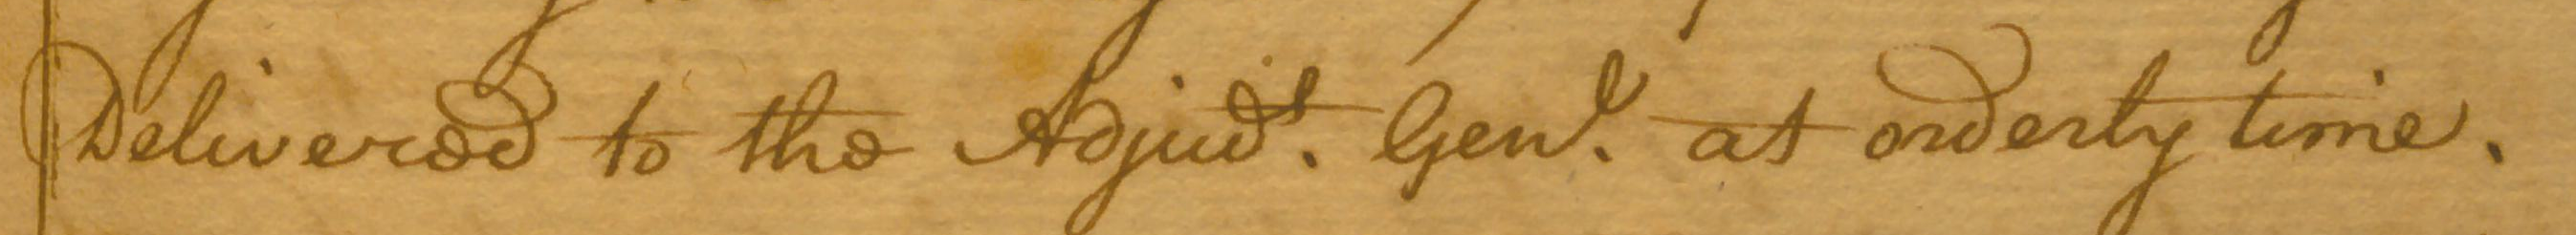Delivered to teh Adjud^t. Gen^l. at orderly time.
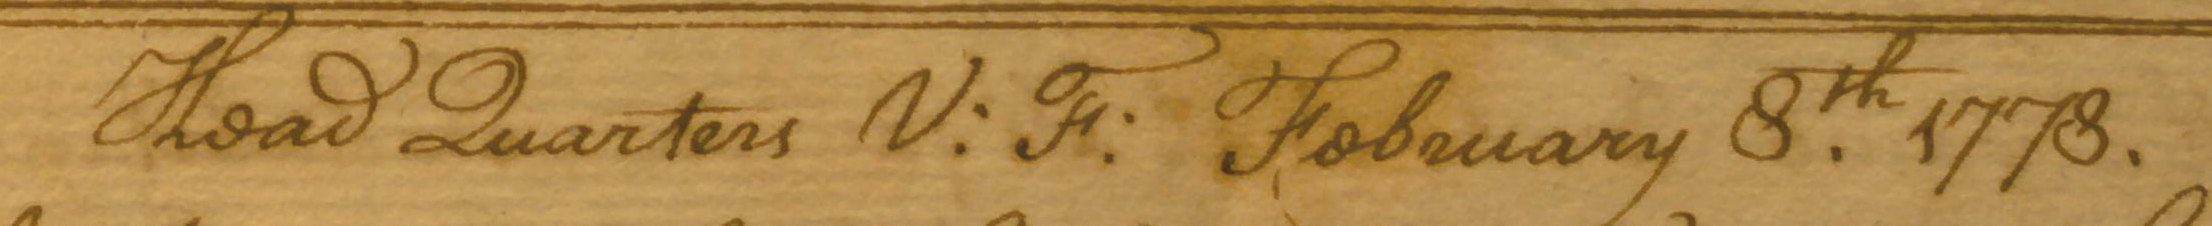Head Quarters V: F: February 8^th. 1778.
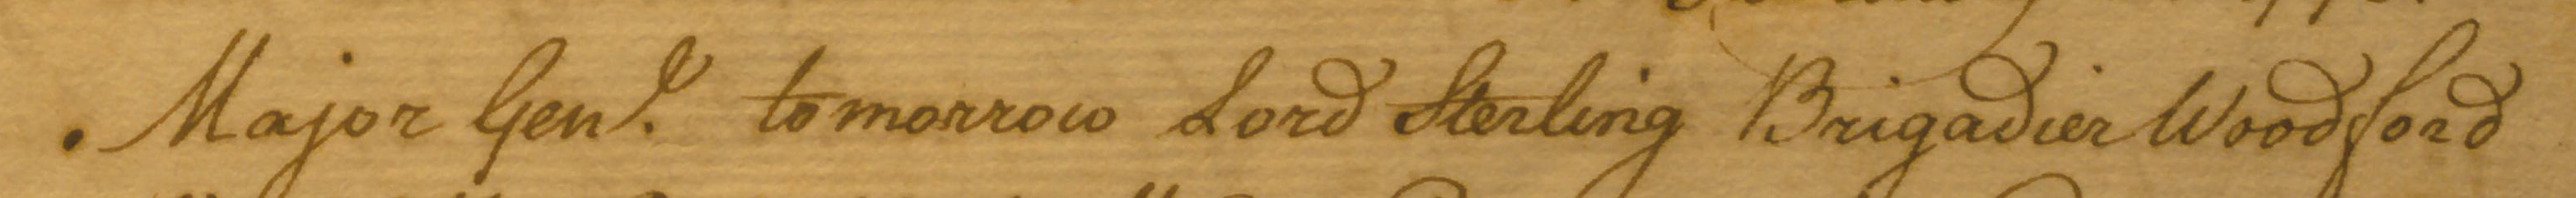Major Gen^l. tomorrow Lord Sterling Brigadier Woodford
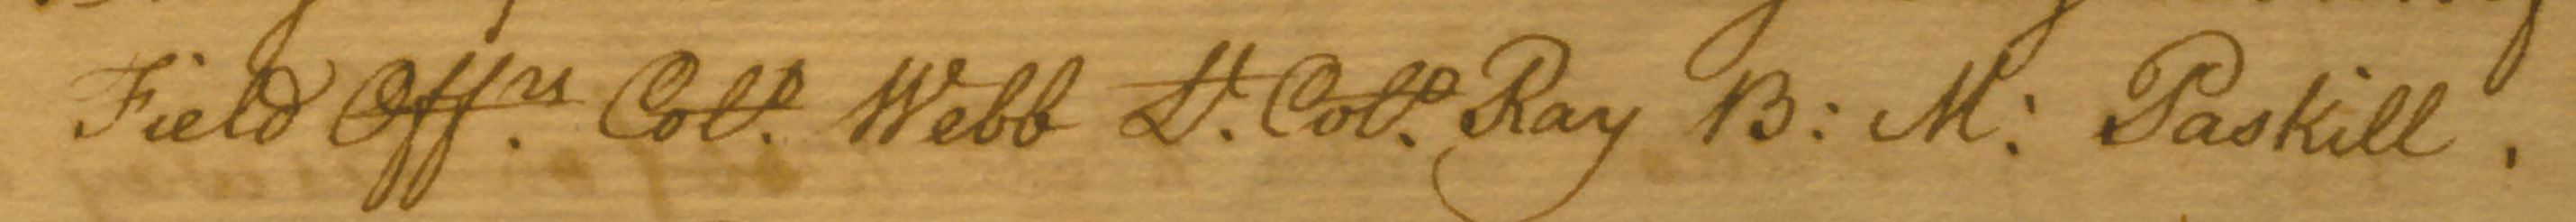Field Off^rs. Col^o. Webb L^t. Col^o. Ray B: M: Paskill.
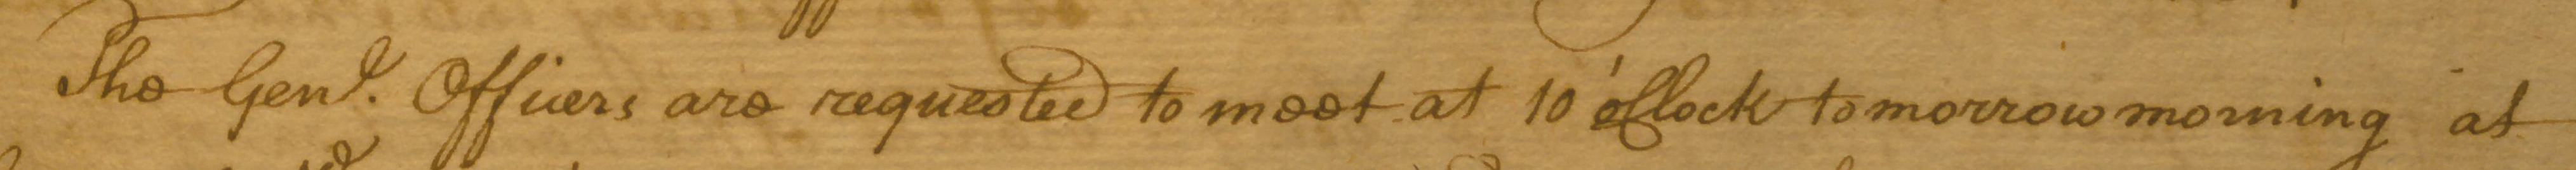The Gen^l. Officers are requested to meet at 10 o'Clock tomorrow morning at
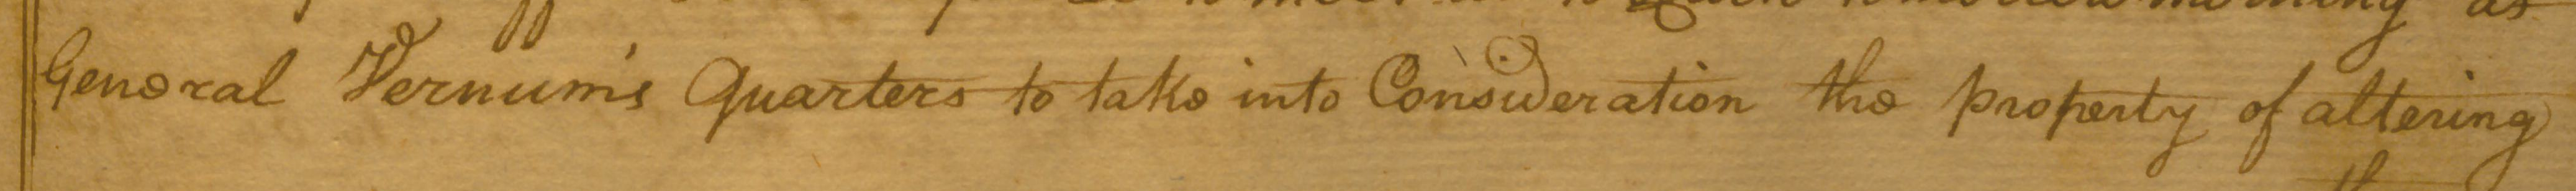General Vernum's quarters to take into Consideration the property of attening
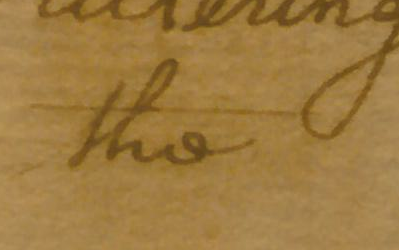the
